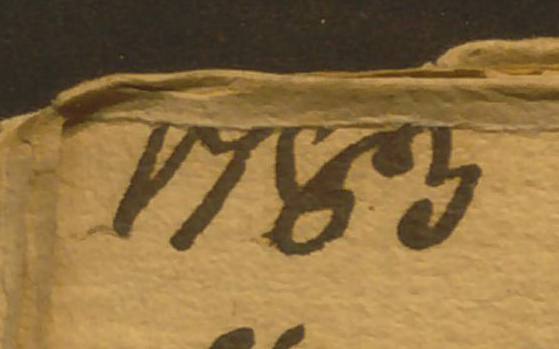1783
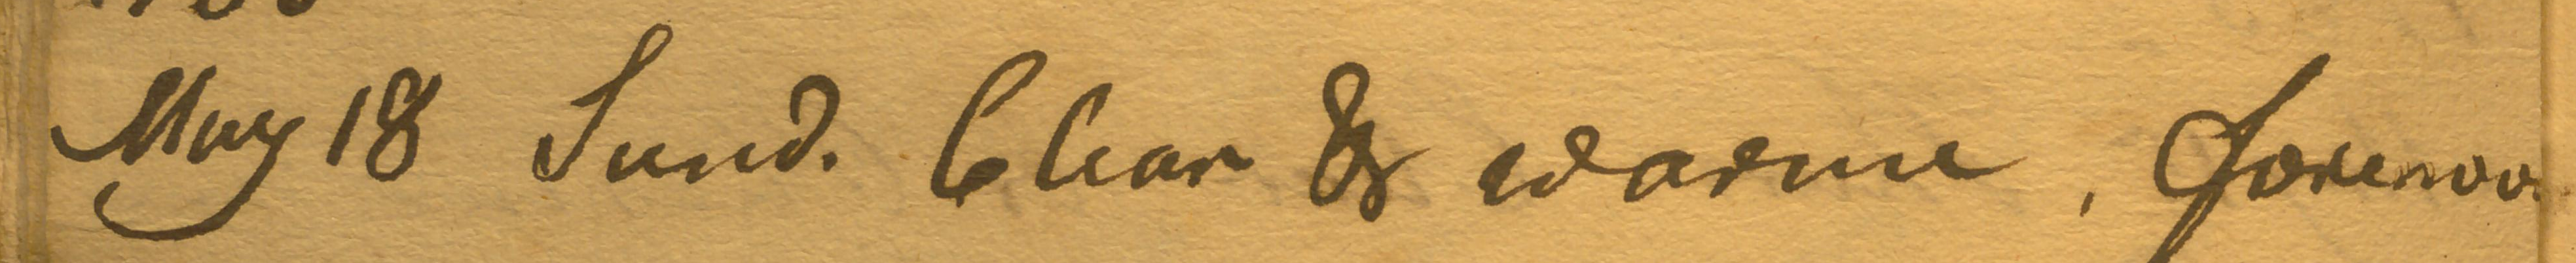May 18 Sund. Clear & warme, forenoon
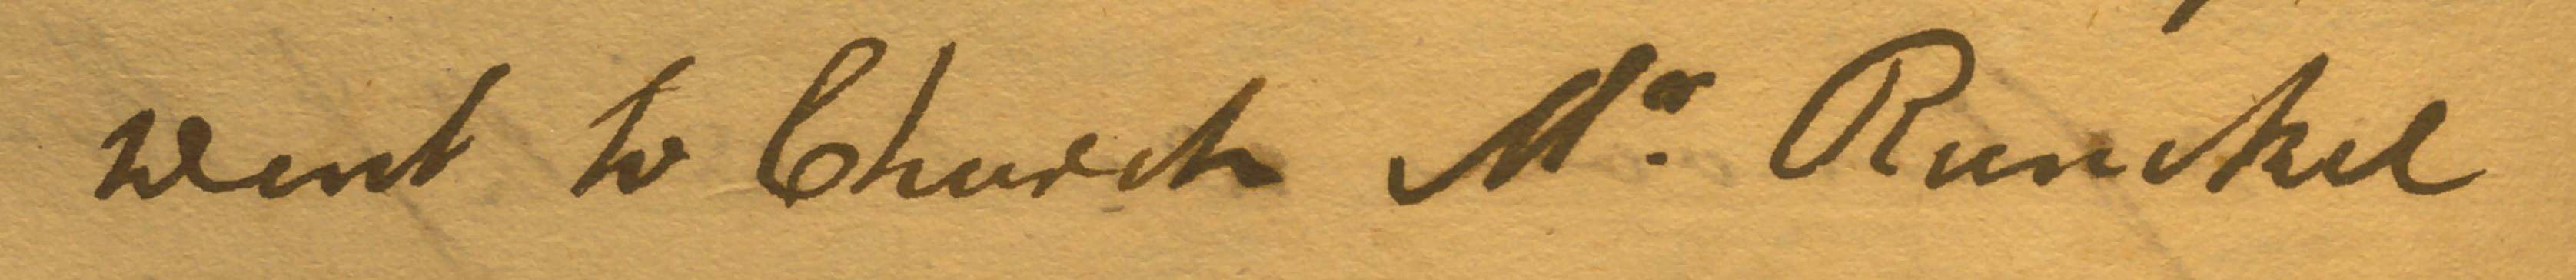went to Church M^r. Runckel
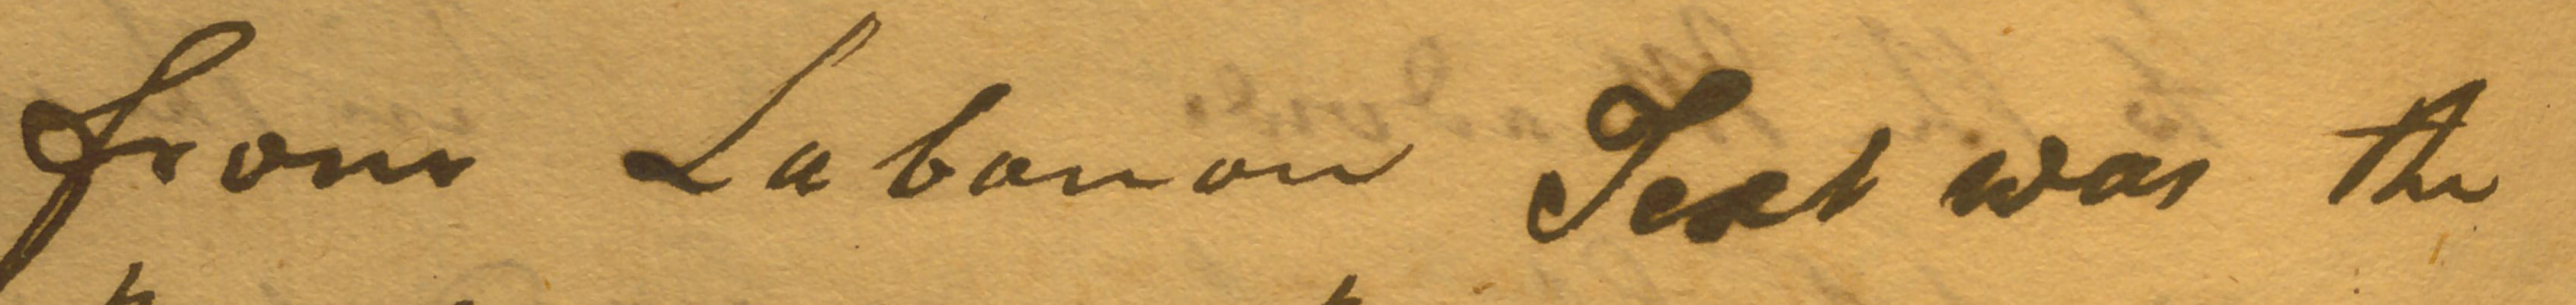from Labanon Text was the
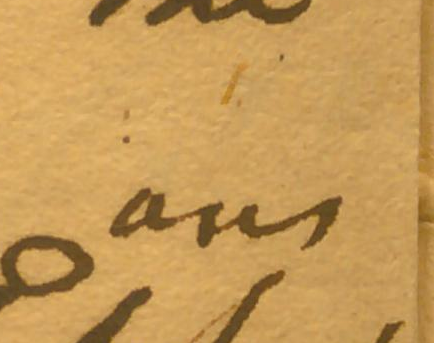anes
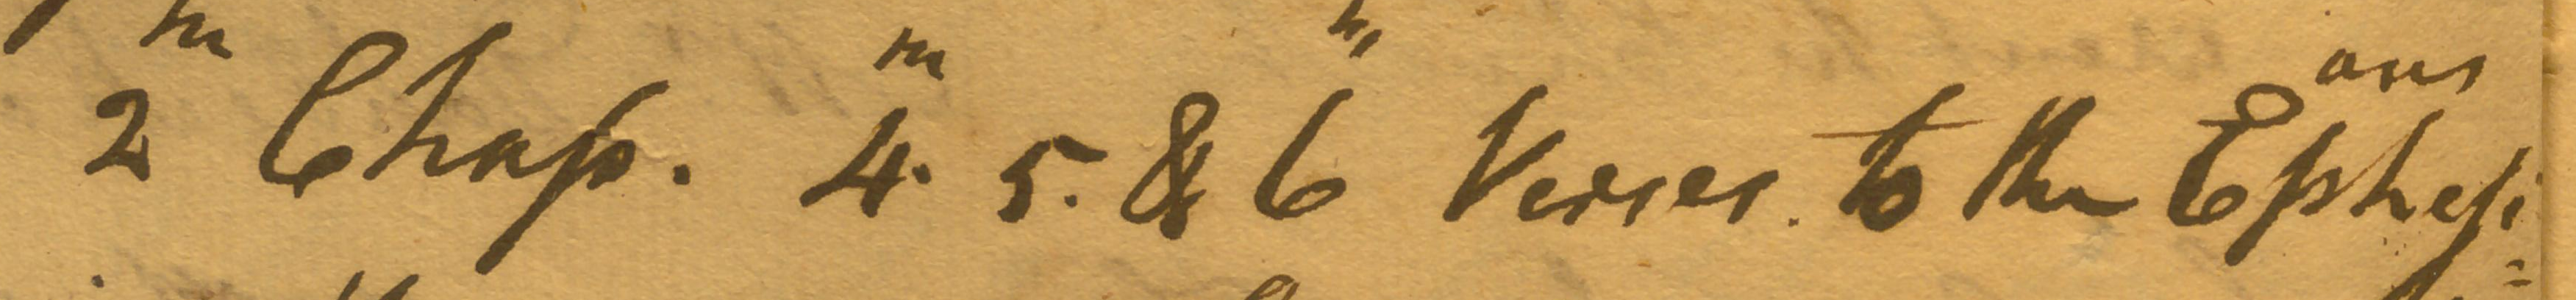2^th Chap. 4^th. 5. & 6^th Verses to the Ephesi^ans
